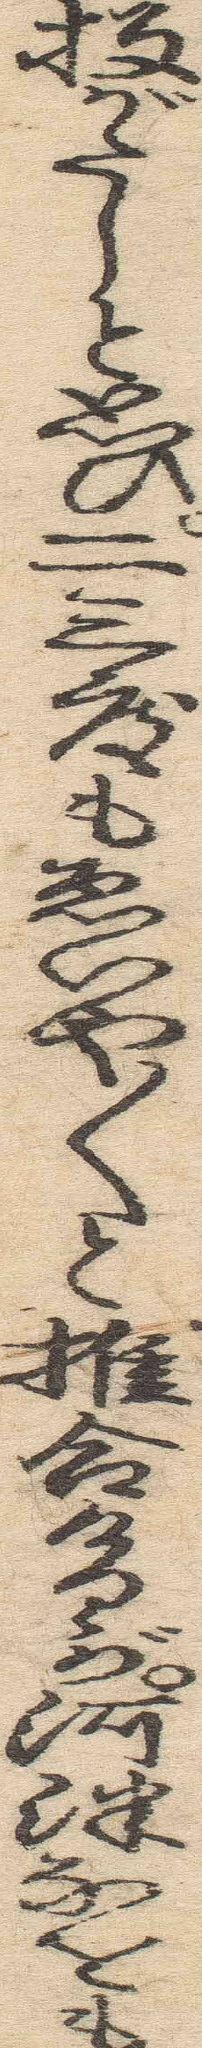投がたしと思ひ。二三度もゑいや〳〵と推合けるが。河津なをも
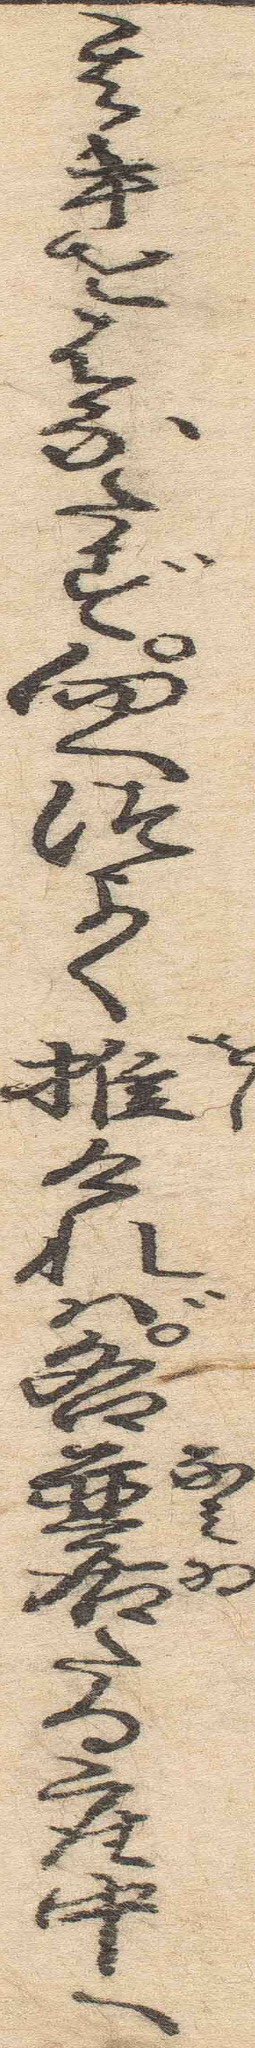其手をはなたず。向へつよく推ければ。各並居たる衆中へ
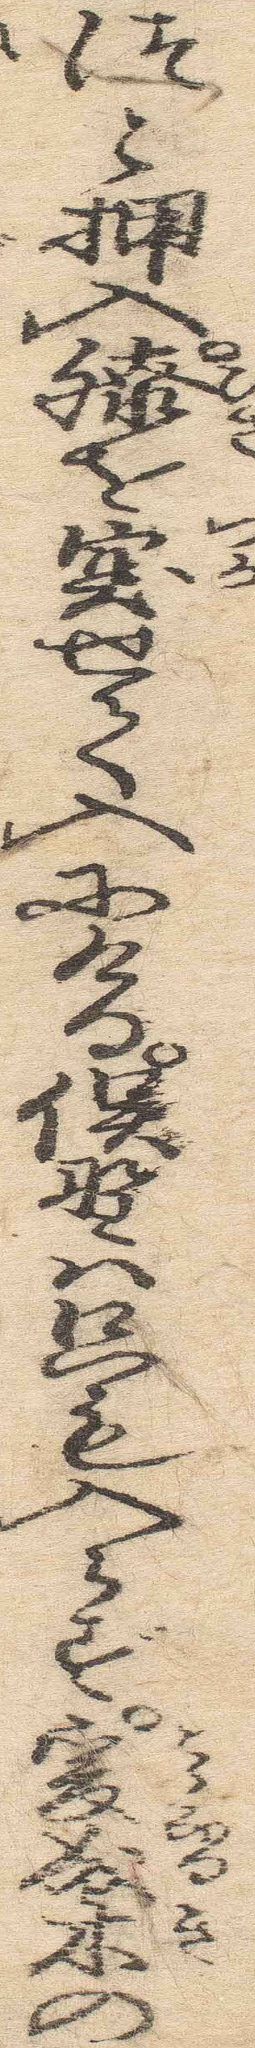つら押入。膝を突せて入にける。俣野は只も入らず。爰成木の
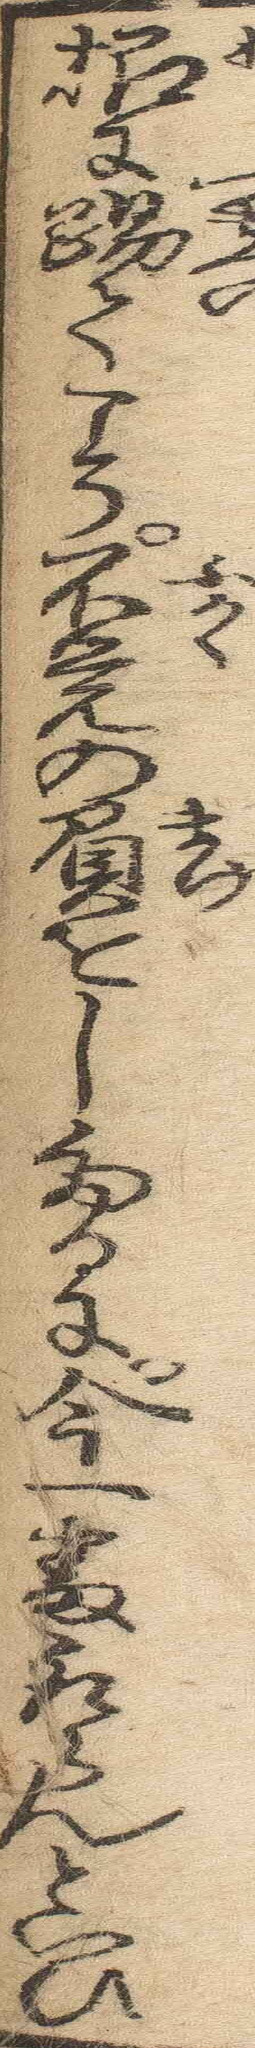根に踢てこそ。不覚の負をしたるに。今一番取らんといひ
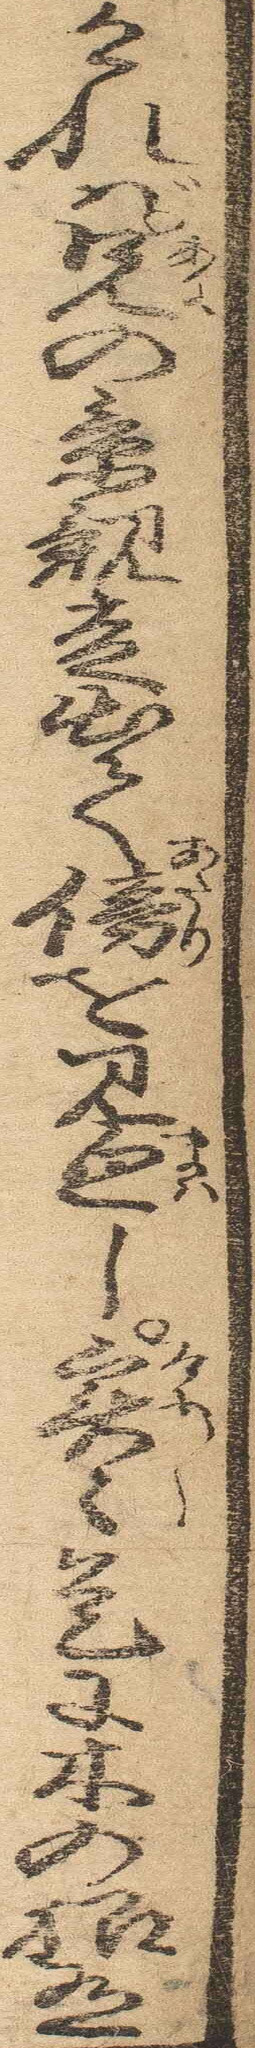ければ兄の景親走出て傍を見廻し。実々是に木の根有
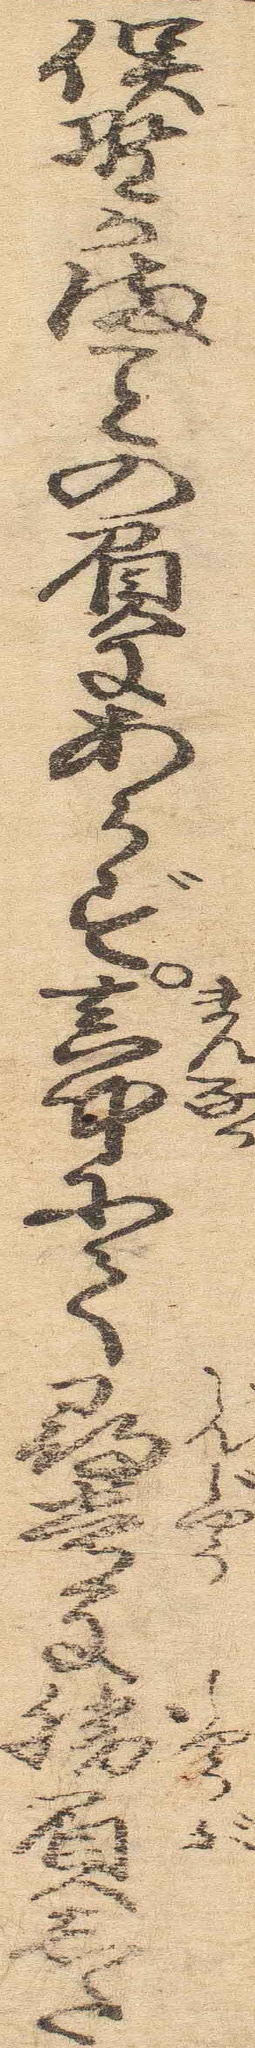俣野かまことの負にあらず。真中にて尋常に勝負した
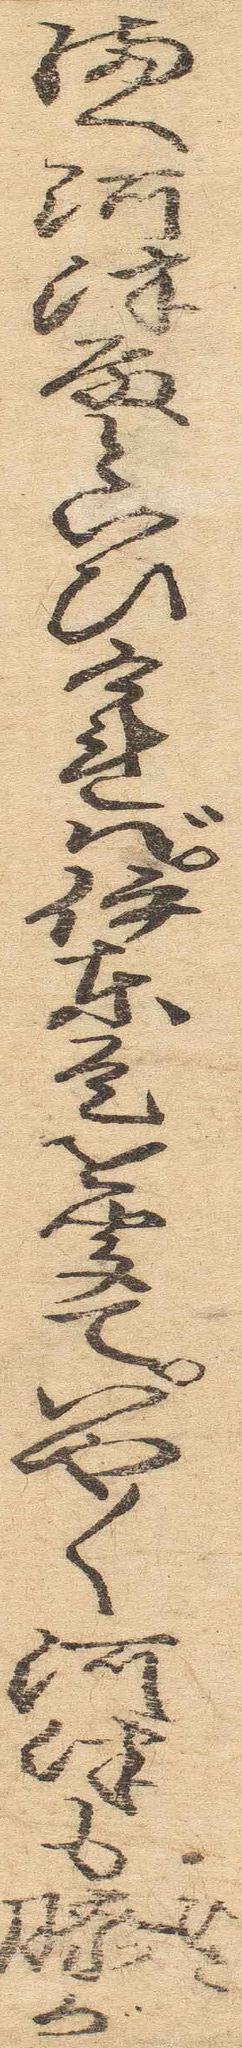まへ河津負といひければ。伊東是を聞て。いや〳〵河津も膝が
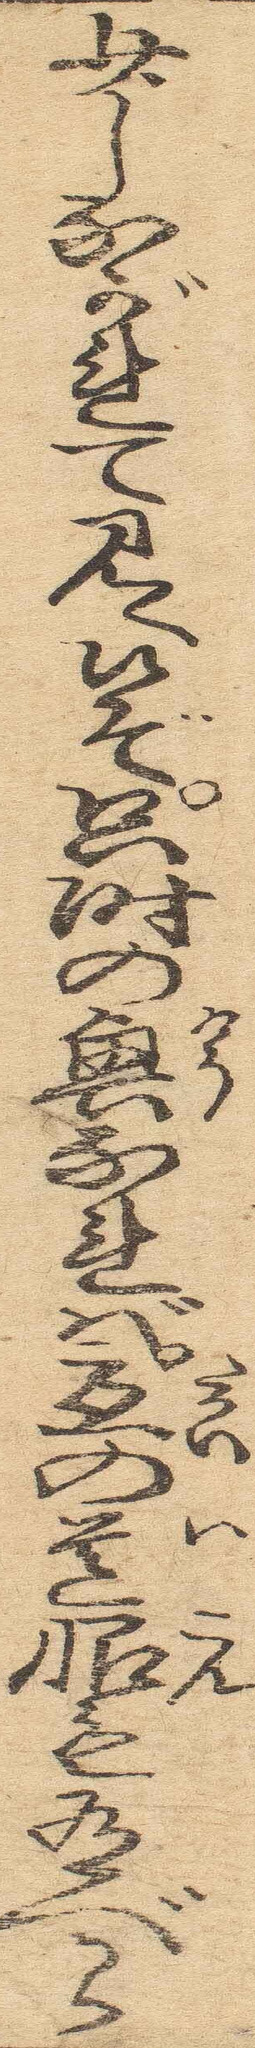少しながれて見へ候ぞ。只時の興なれば。互の意恨も有べから
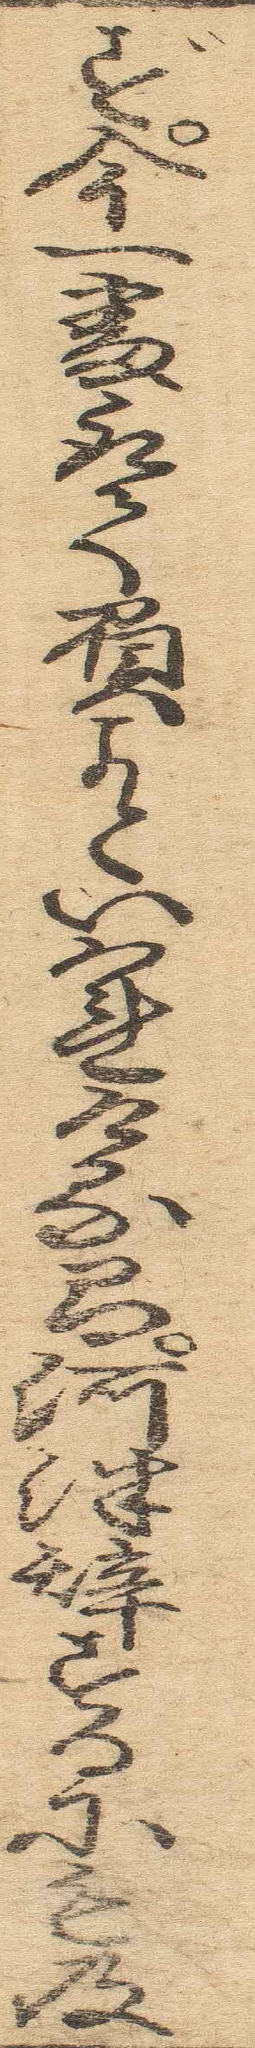ず。今一番取て負よといはれける間。河津辞するにも及
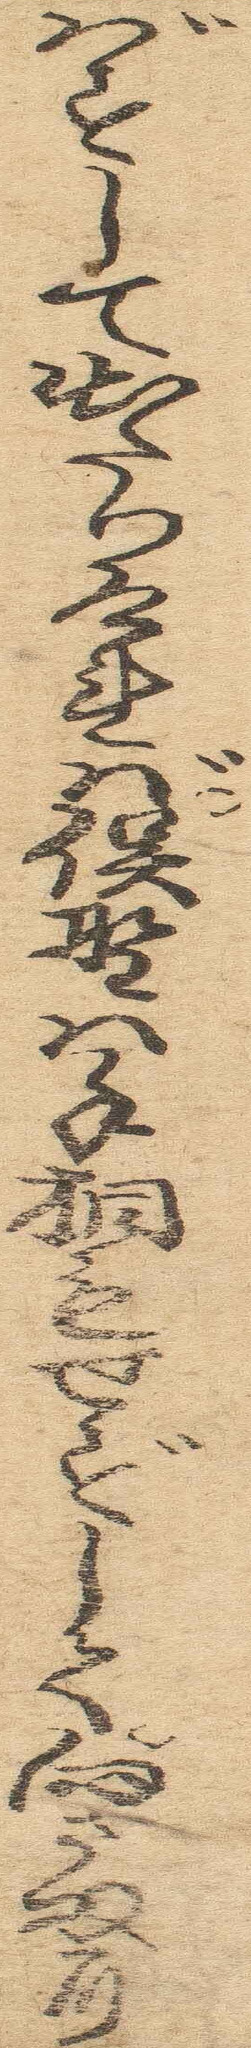ばすして出たりければ。俣野は手相もせずして。向さまに
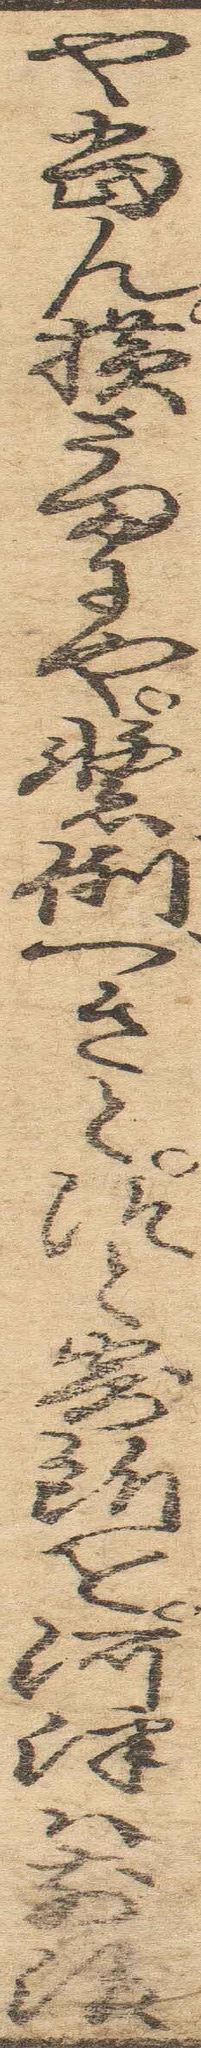や当ん。横さまにや。繋倒べきと。つと寄所を。河津は前後
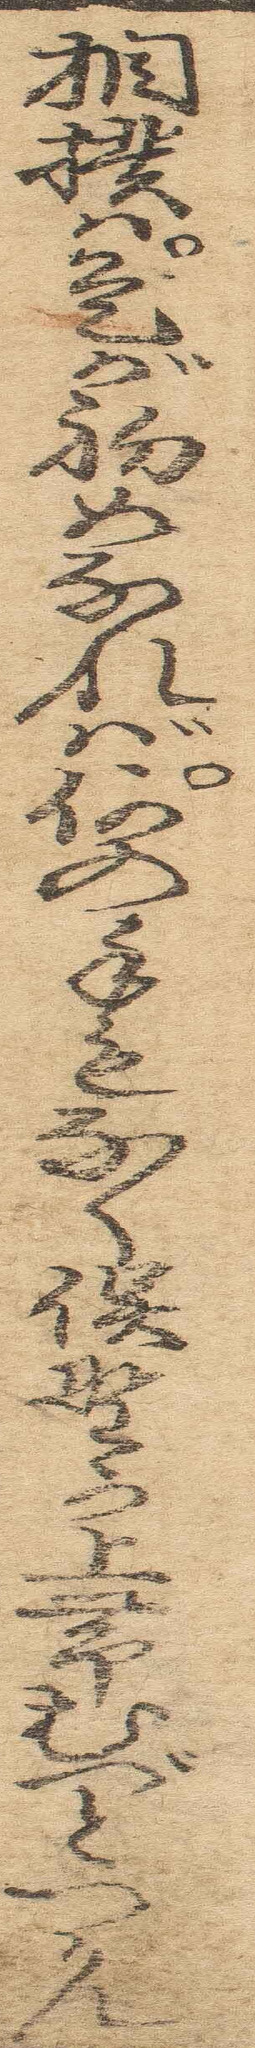相撲は。是が初めなれば何の手もなく俣野か上帯むづとつかん
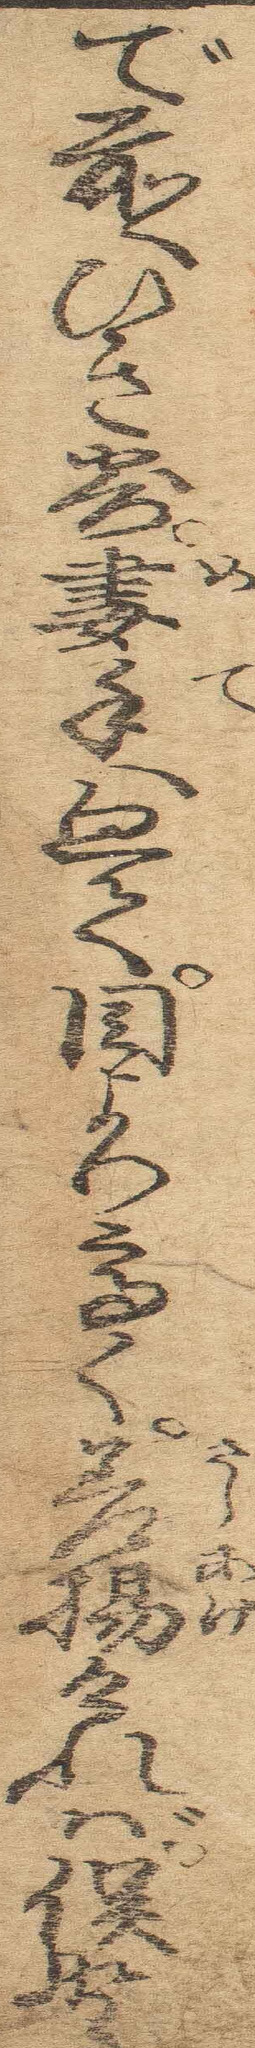で前へひき寄。妻手へ廻て。目より高く。差揚ければ俣野

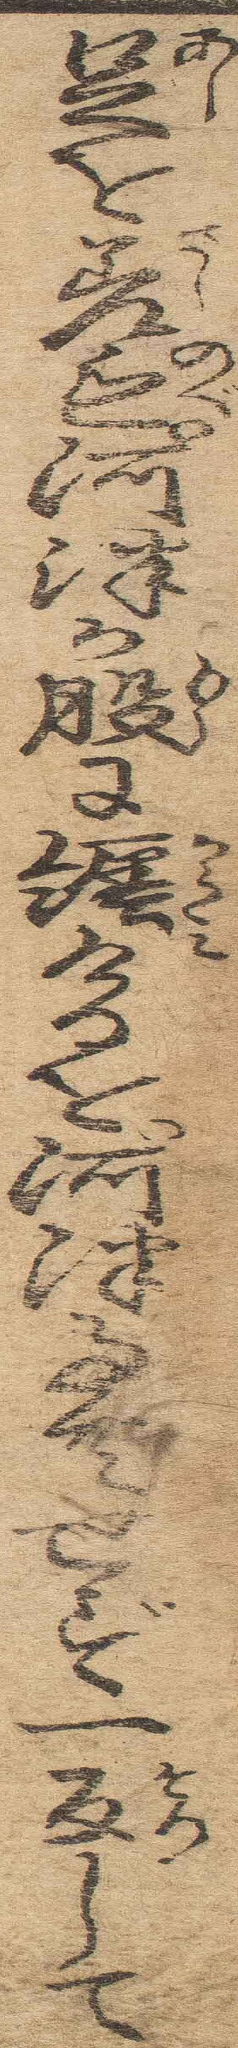足を差延。河津か股に纏けるを。河津事ともせず一反して
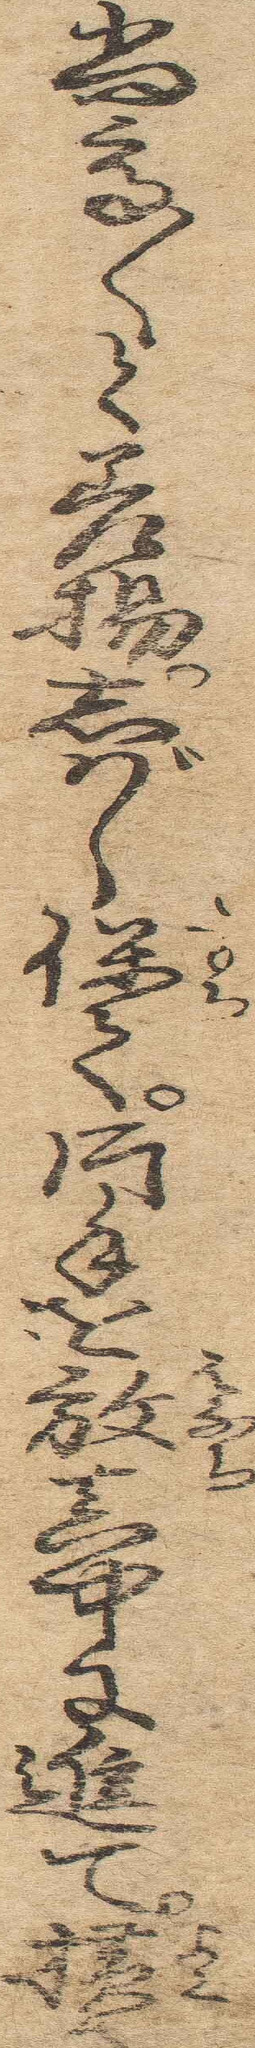尚高〳〵と差揚。しばし保て。片手を放真中に進て横さ
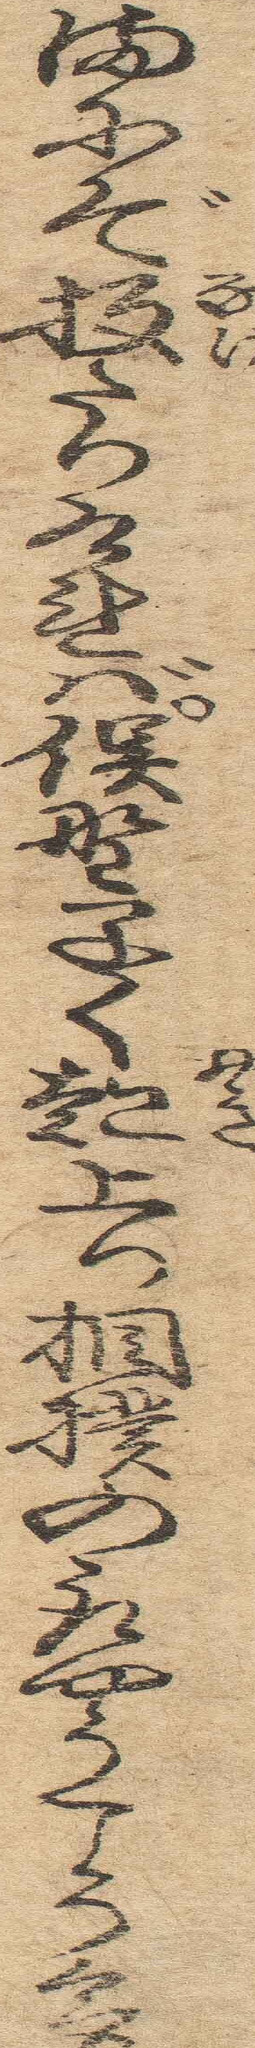まにぞ投たりければ。俣野早々起上り相撲の取やうこそ多
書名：古今相撲大全
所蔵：東京学芸大学附属図書館 国文学研究資料館
